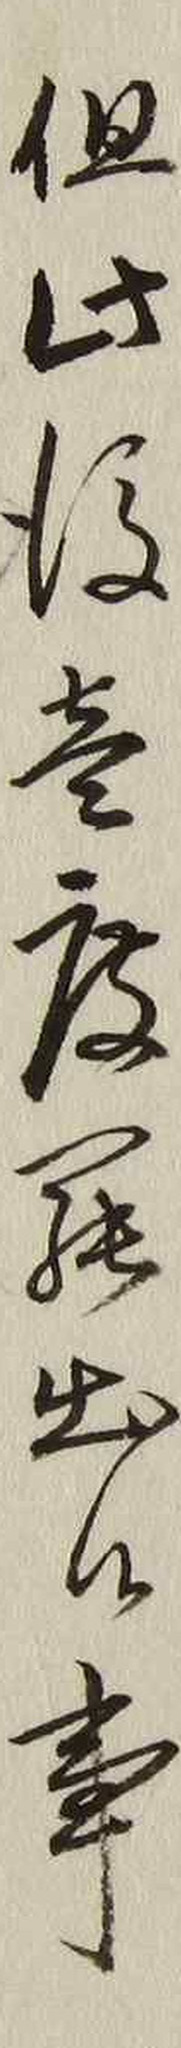但此後壱度罷出候事
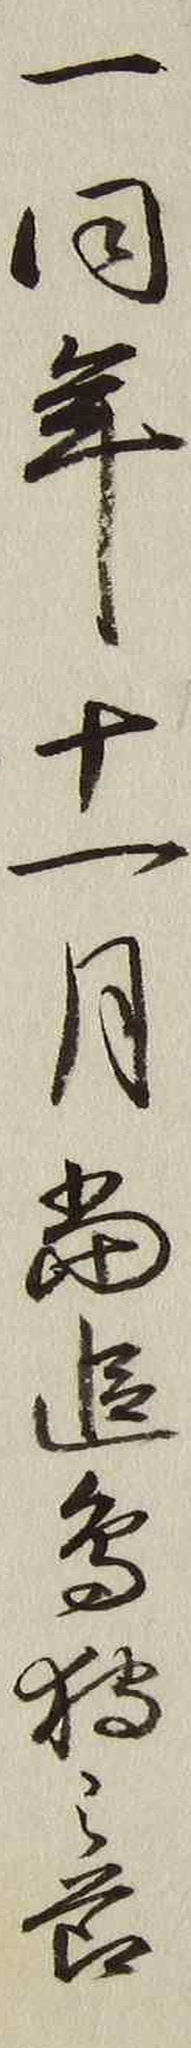一同年十一月当追鳥狩之節
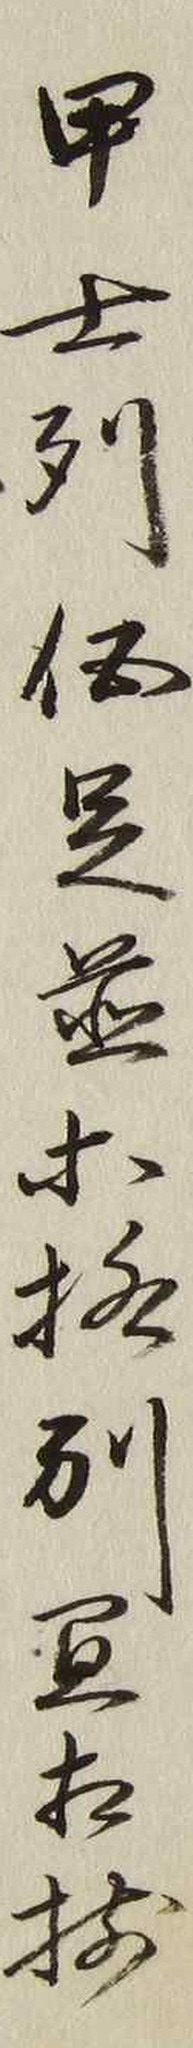甲士列伍足並等格別宜相揃
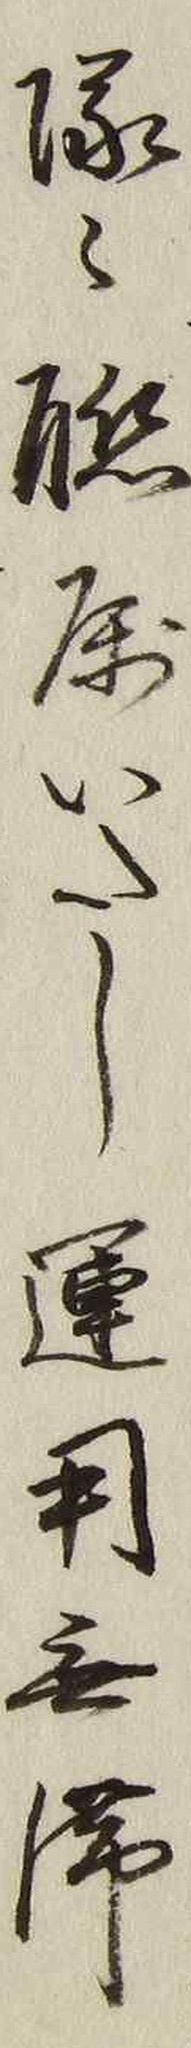隊之聯属いたし運用無滞
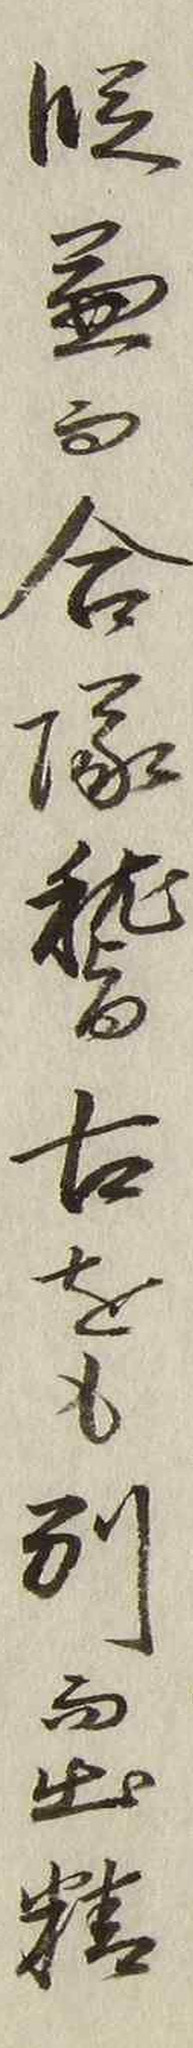段兼而合隊稽古をも別而出精
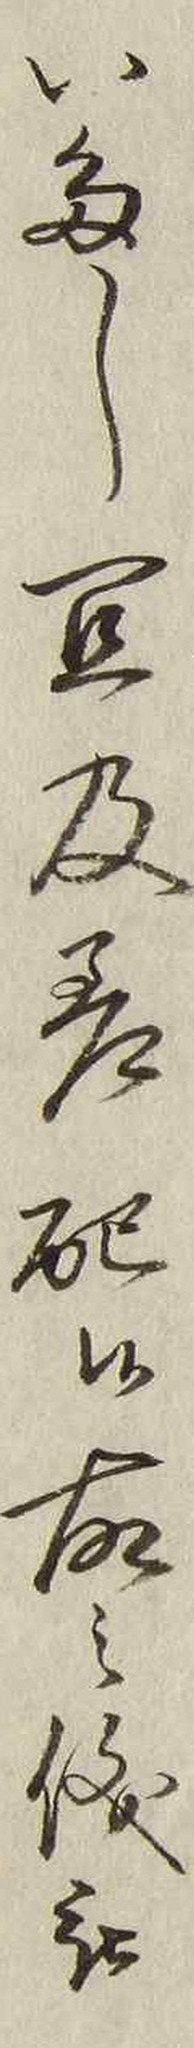いたし宜及差配候故之儀被

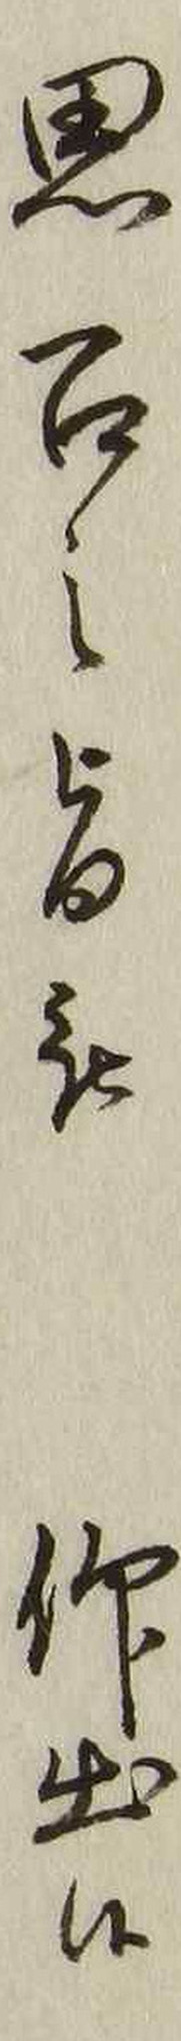思召之旨被仰出候
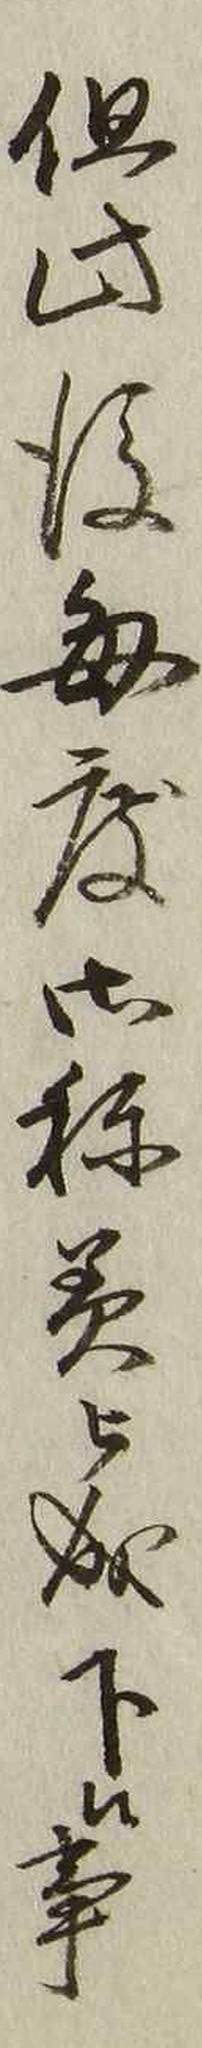但此後毎度御称美被成下候事
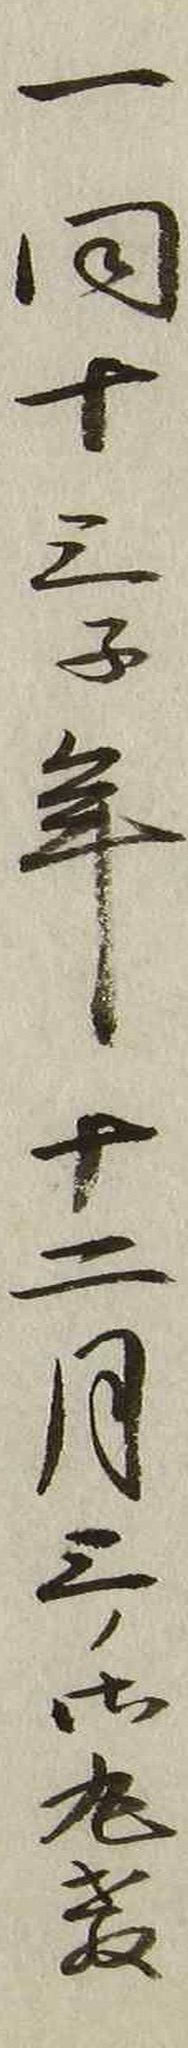一同十三子年十二月三御丸教
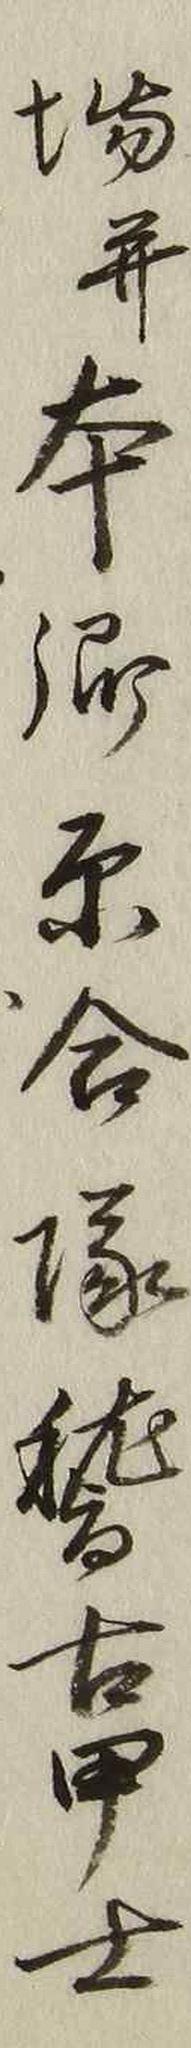場并本郷原合隊稽古項甲士
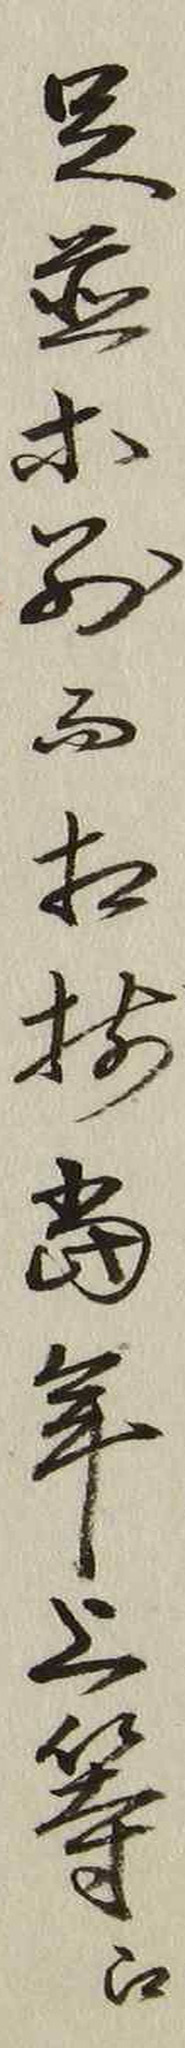足並等別而相揃当年上等江
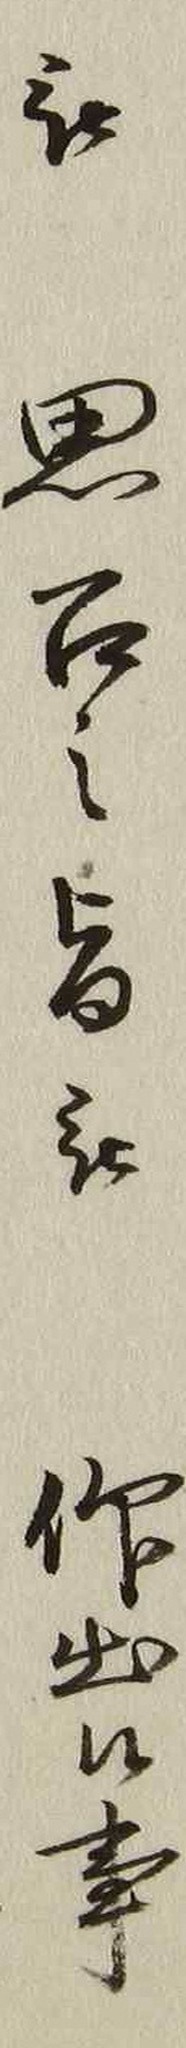被思召之旨被仰出候事
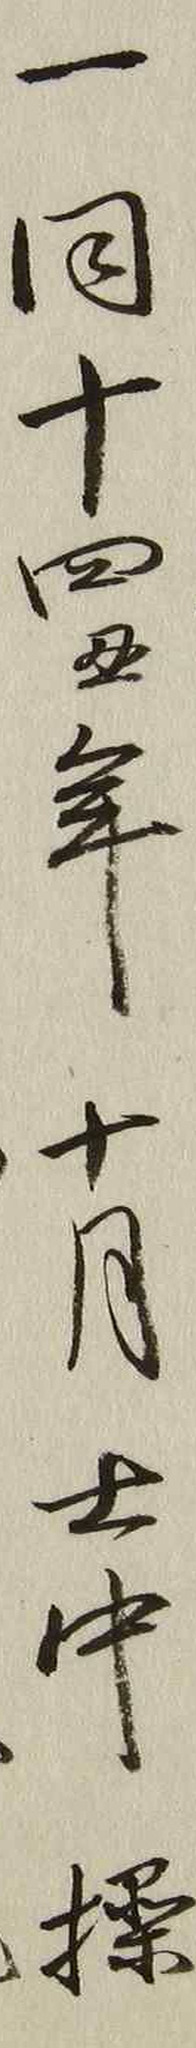一同十四丑年十月士中操
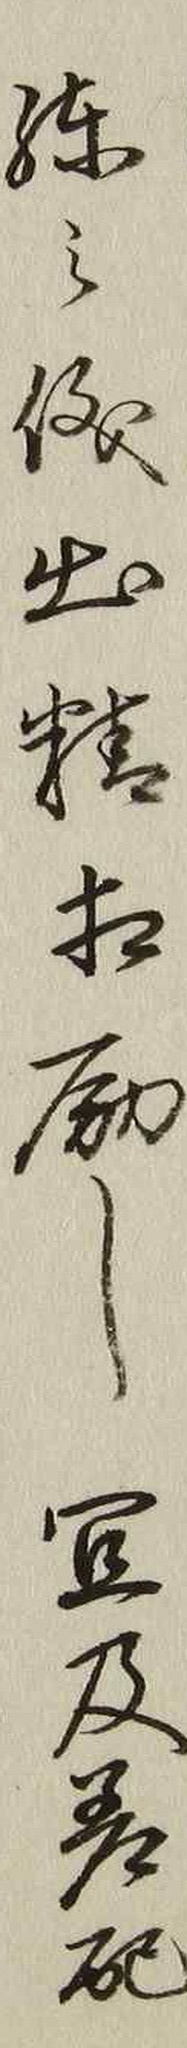練之儀出精相励し宜及差配
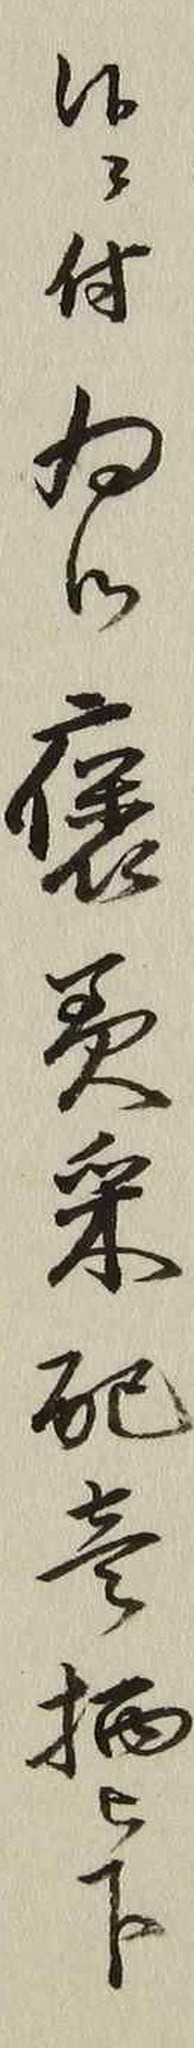候ニ付為御褒美采配壱柄被下
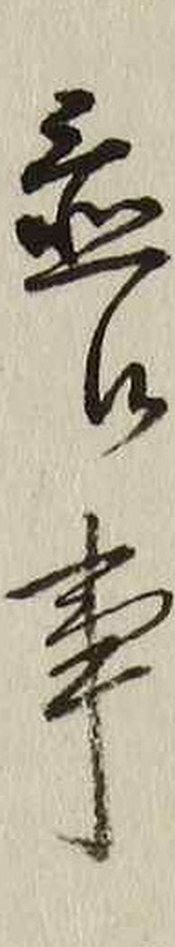置候事
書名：諸士系譜　巻之136　た之部12
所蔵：会津若松市立会津図書館
